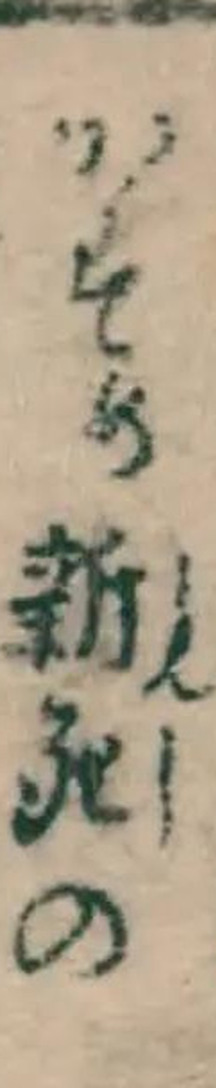かすめ新死の
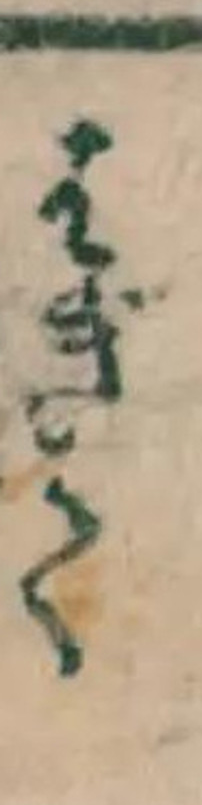はぎて
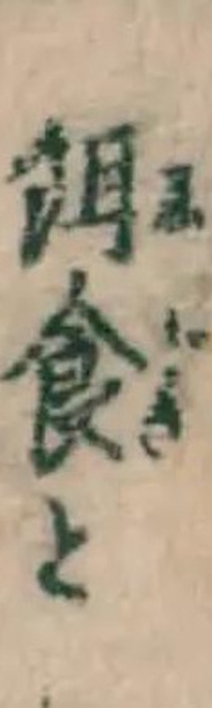餌食と
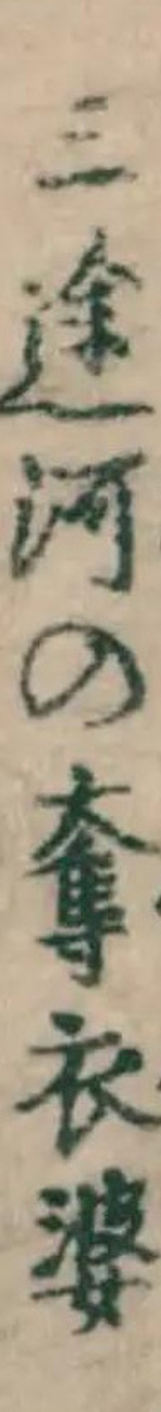三途河の脱衣婆
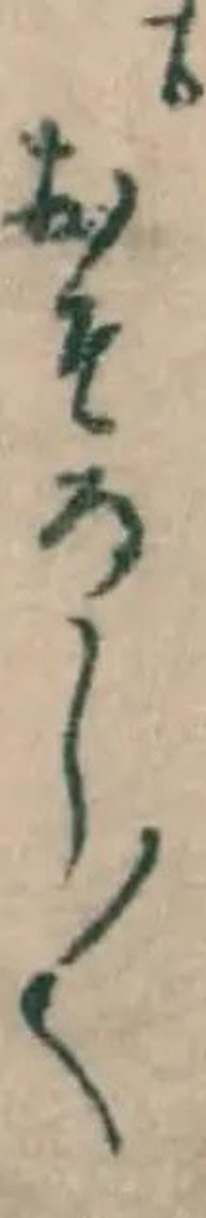おそろし〳〵

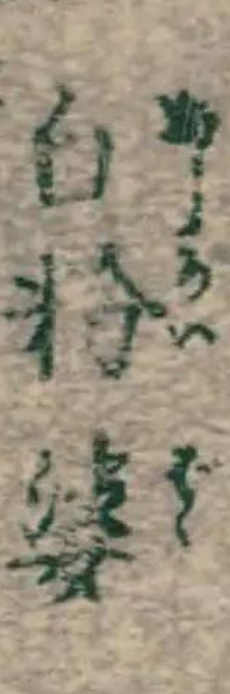白粉婆
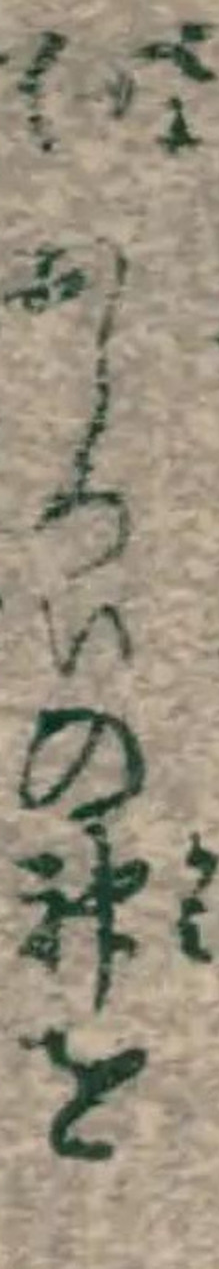紅おしろいの神を
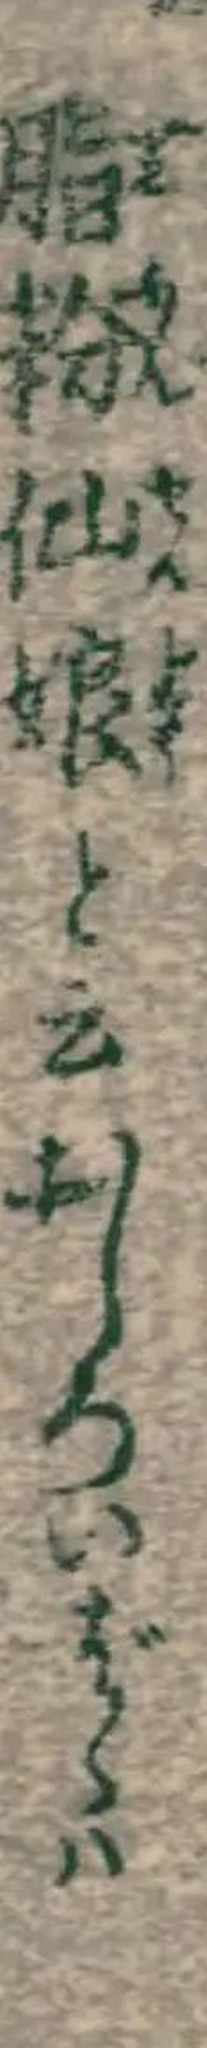脂粉仙娘と云おしろいばゞは
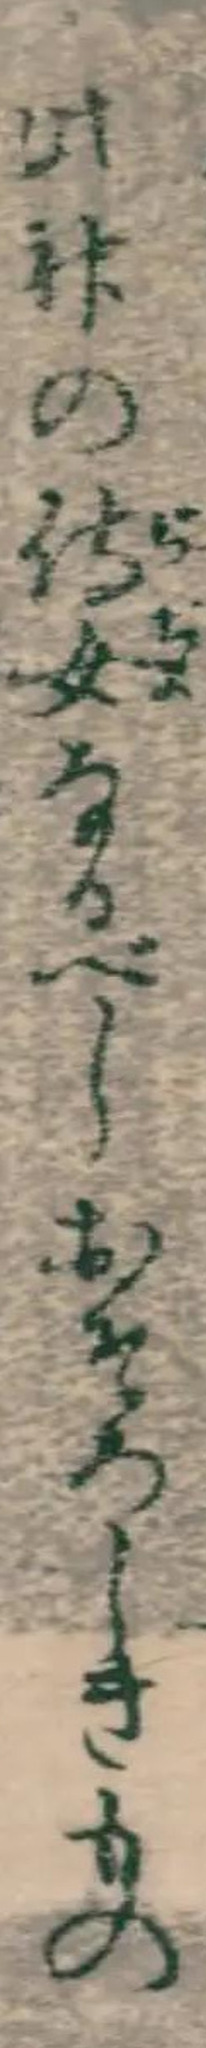此神の侍女なるべしおそろしきもの
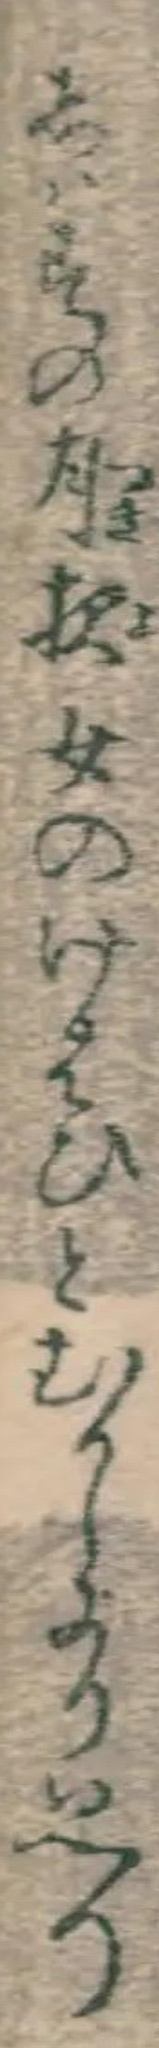しはすの月夜女のけはひとむかしよりいへり
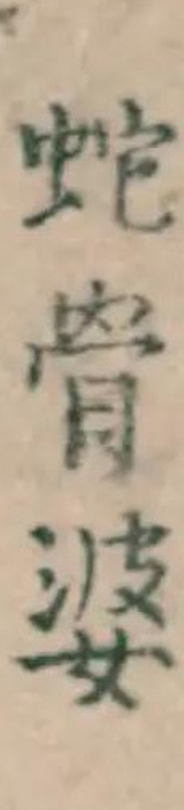蛇骨婆
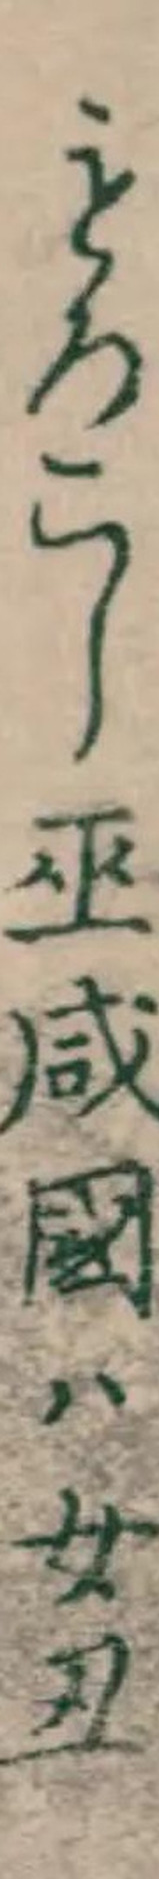もろこし巫咸国は女丑
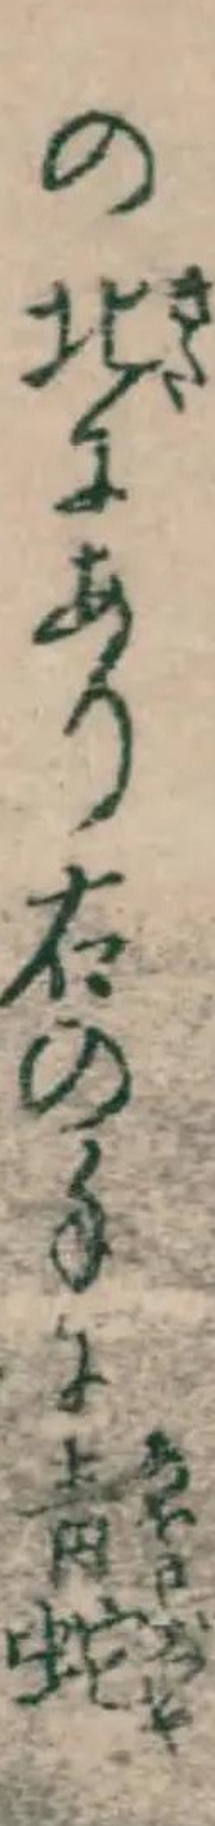の北にあり右の手に青蛇
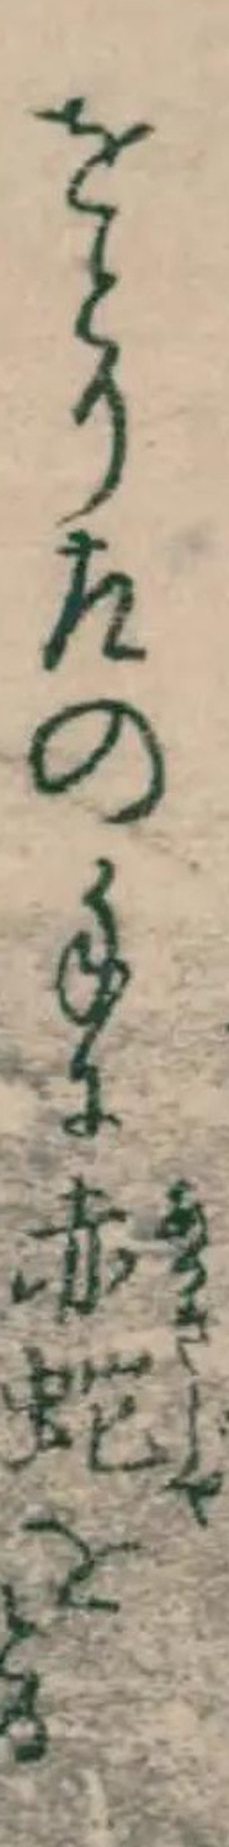をとり左の手に赤蛇をとる
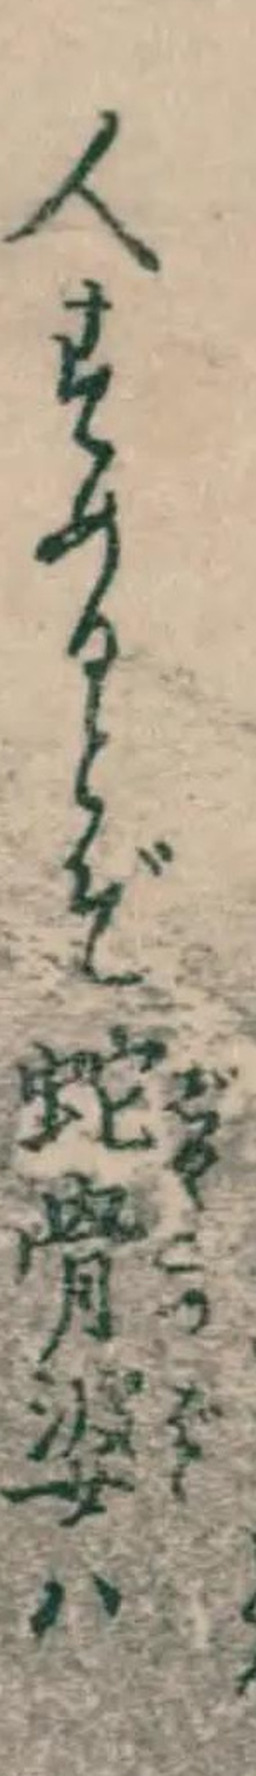人すめるとぞ蛇骨婆は
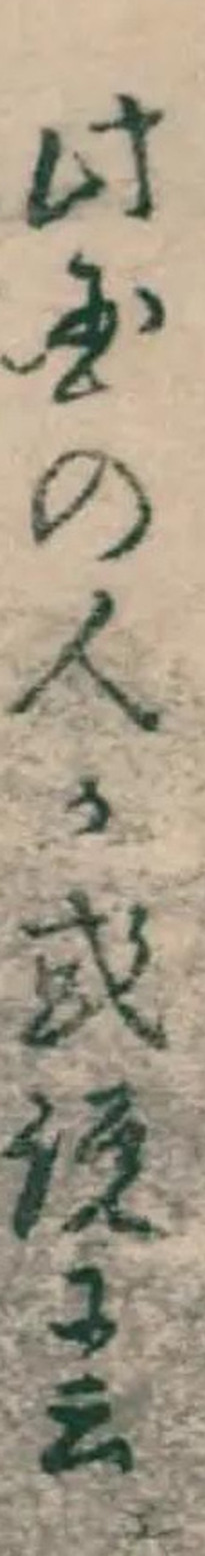此国の人か或説に云
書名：百鬼夜行 3巻拾遺3巻. [2]
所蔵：国立国会図書館 National Diet Library, JAPAN
